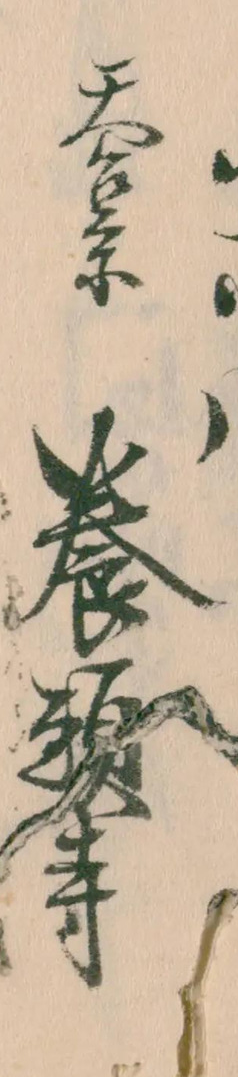天台宗養願寺
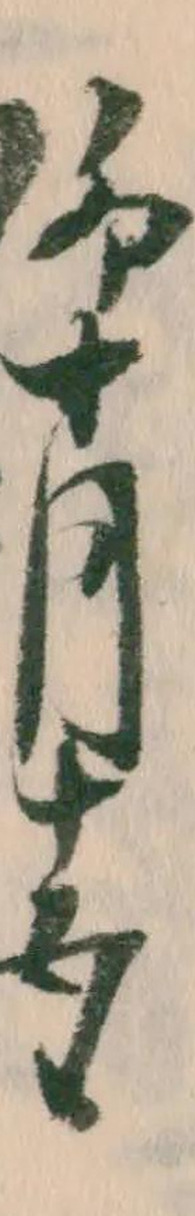卯十月十五日
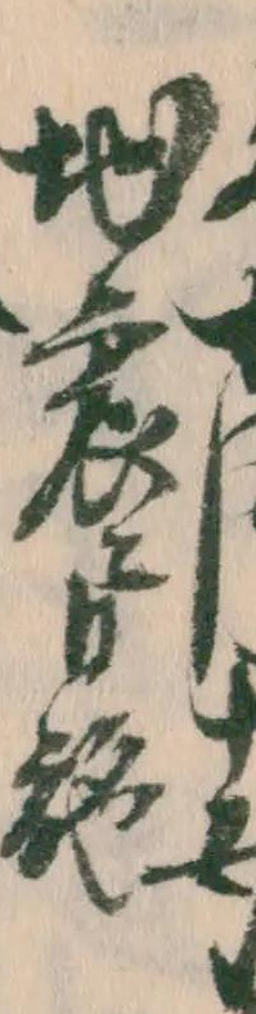地震ニ付施
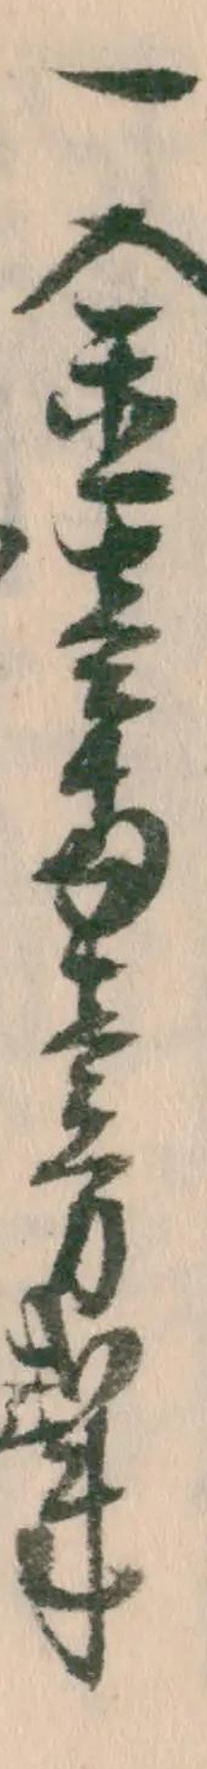一金壱両壱分弐朱
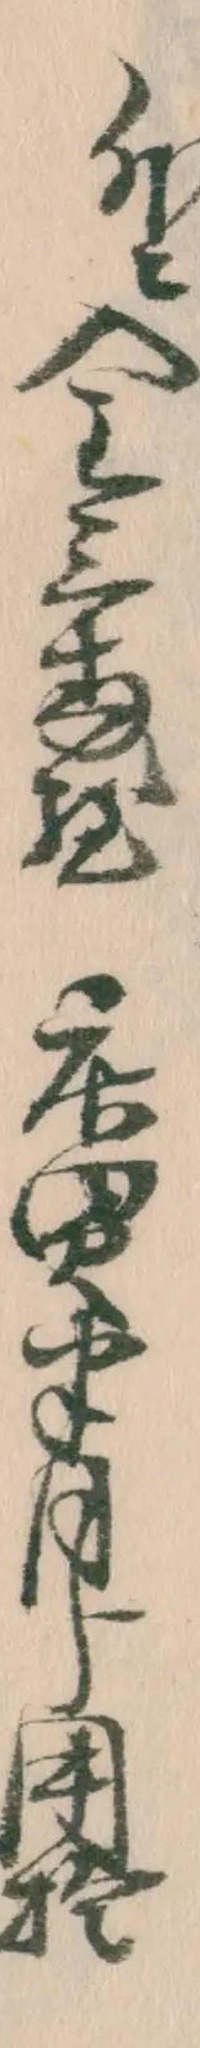外ニ金三両程店賃半月分用捨
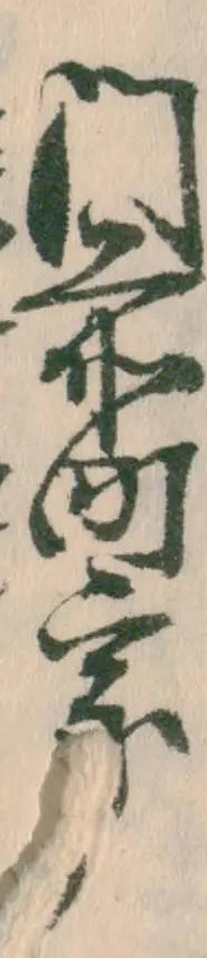門前町家

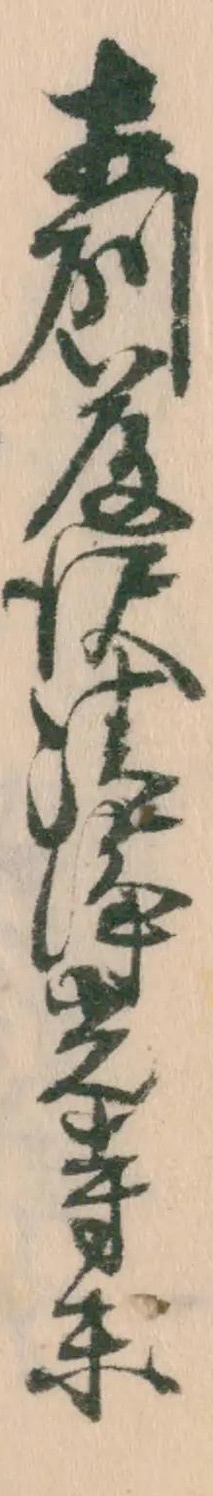相州藤沢清浄光寺末
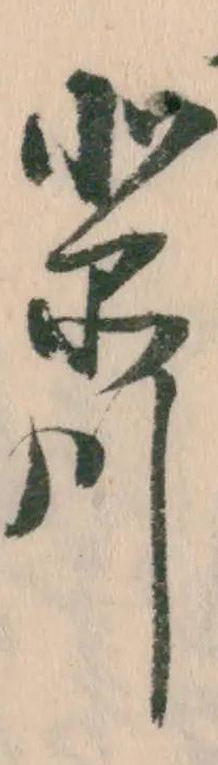北品川
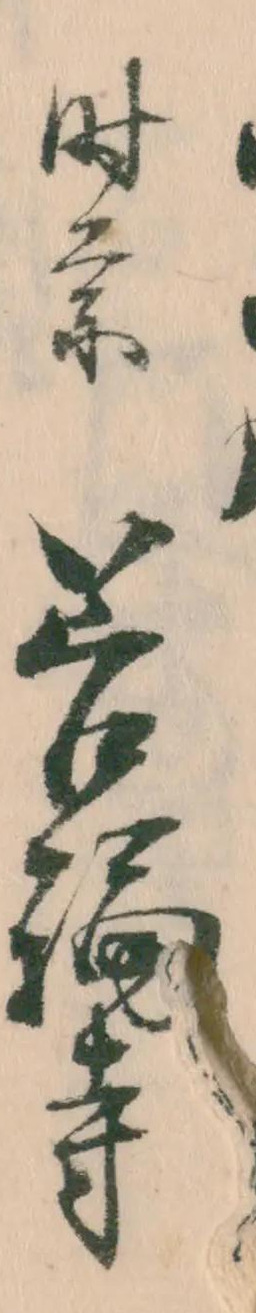時宗善福寺
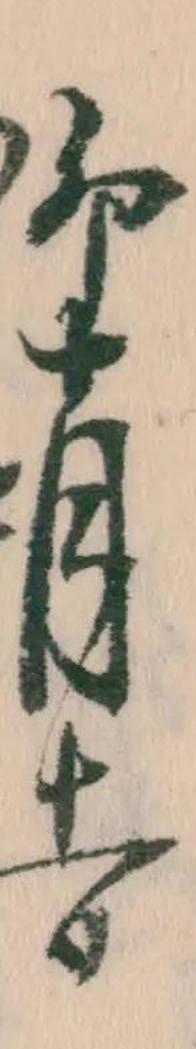卯十月十一日
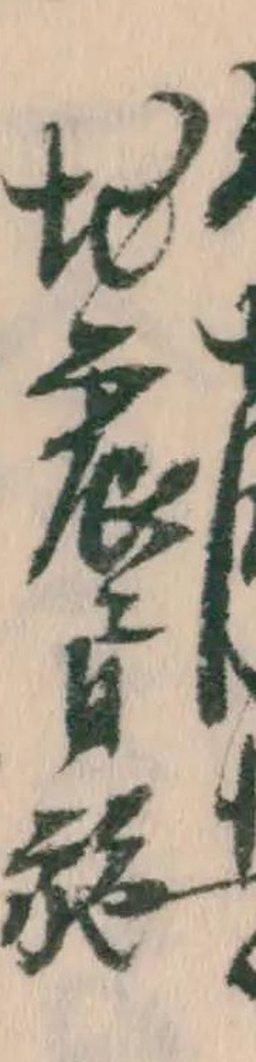地震ニ付施
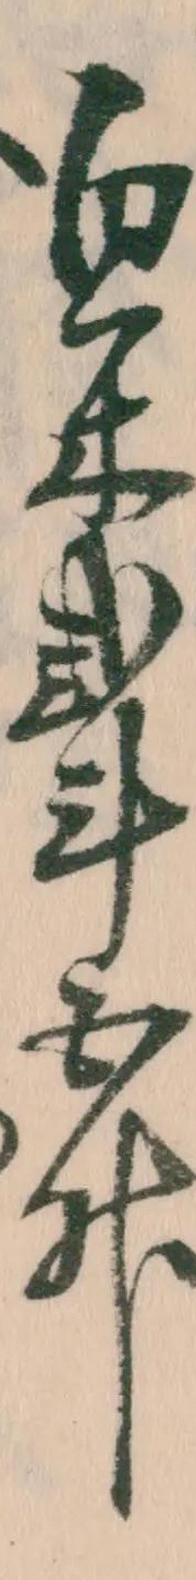一白米弐斗五升
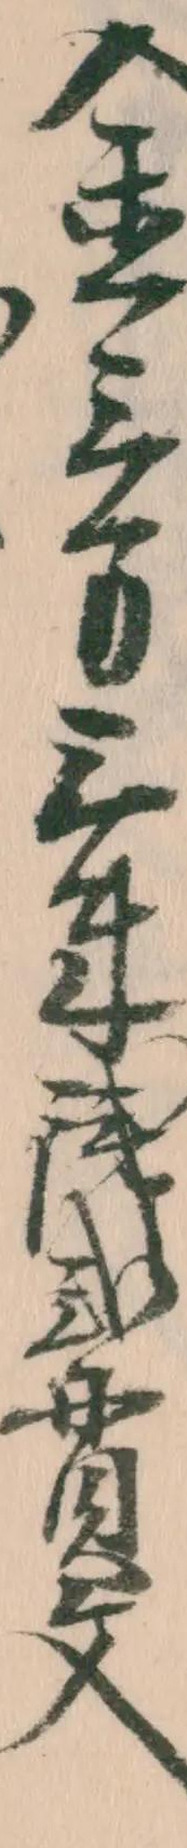金三分三朱銭弐貫文
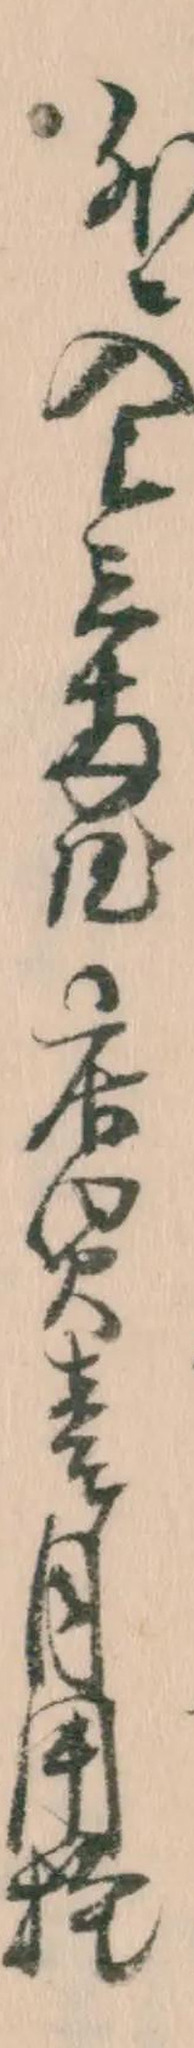外ニ金三両程店賃壱ケ月用捨
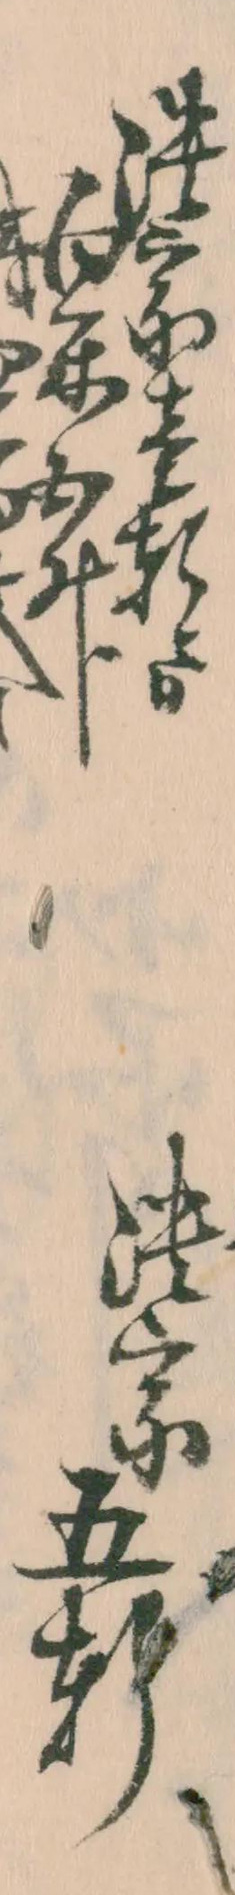白米五升潰家五軒
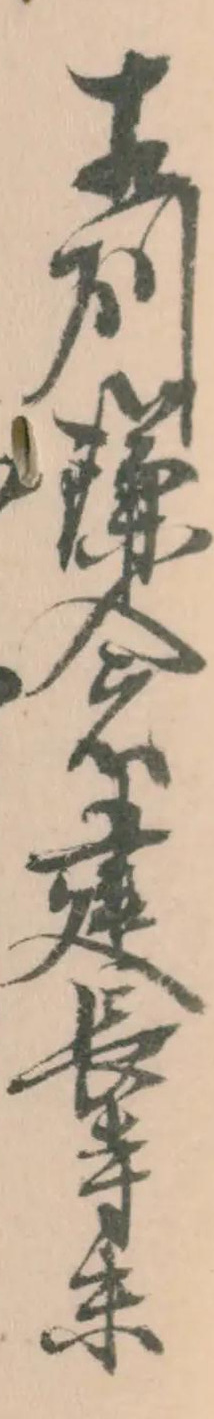相州鎌倉建長寺末
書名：武家方并寺院等ニテ施差出候一件
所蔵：国立国会図書館 National Diet Library, JAPAN
